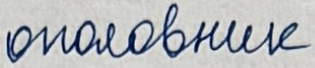ополовник
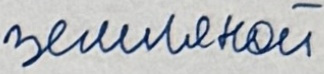земляной
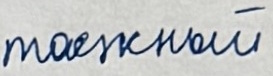таежный
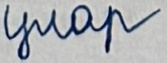улар
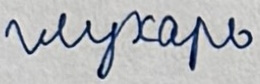глухарь
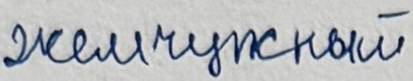жемчужный
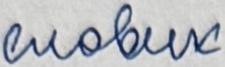еловик
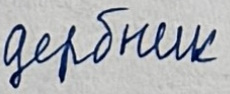дербник
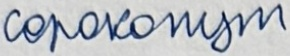сорокопут
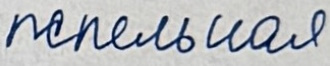пепельная
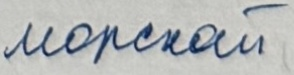морской
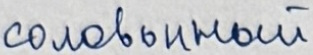соловьиный
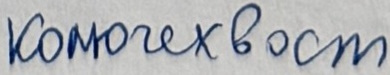колючехвост
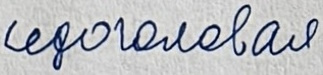седоголовая
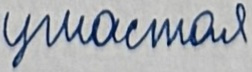ушастая
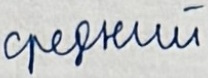средний
